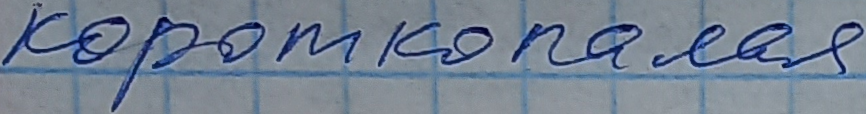короткопалая
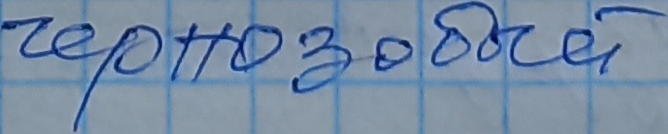чернозобый
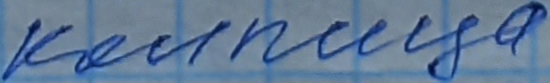колпица
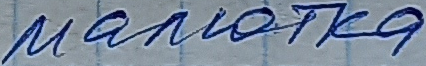малютка
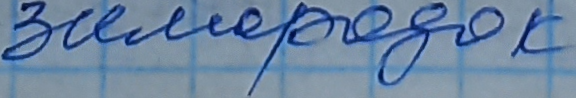зимородок
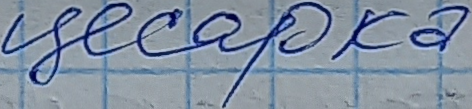цесарка
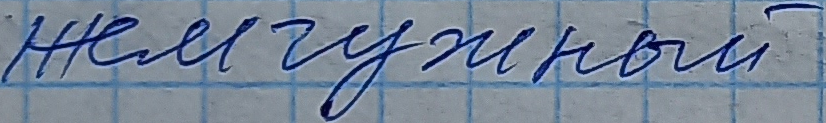жемчужный
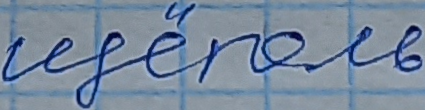щёпель
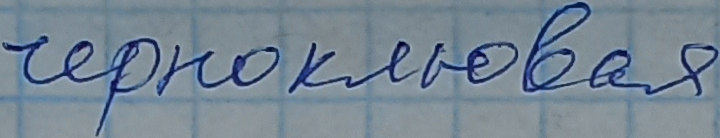черноклювая
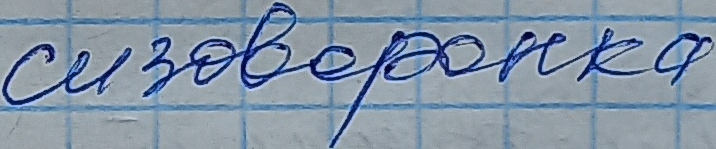сизоворонка
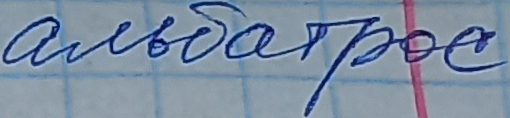альбатрос
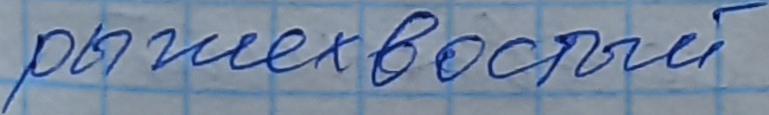рыжехвостый
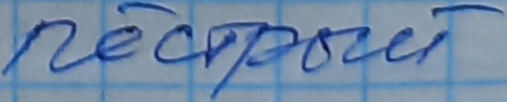пёстрый
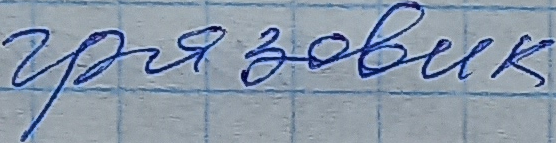грязовик
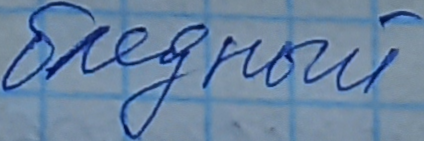бледный
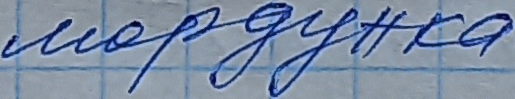мордунка
